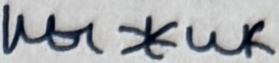пыжик
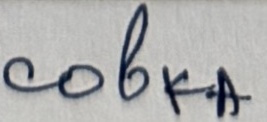совка
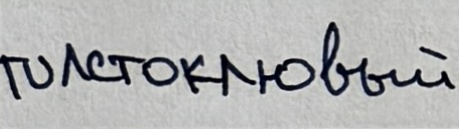толстоклювый
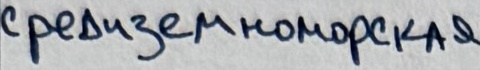средиземноморская
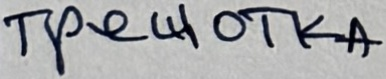трещотка
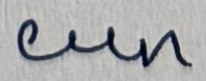сип
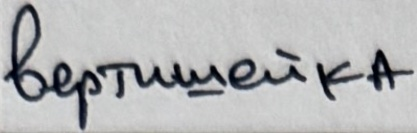вертишейка
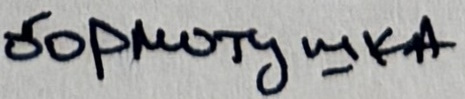бормотушка
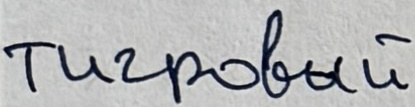тигровый
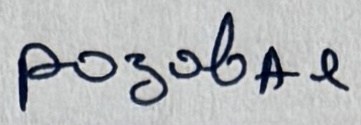розовая
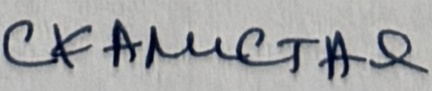скалистая
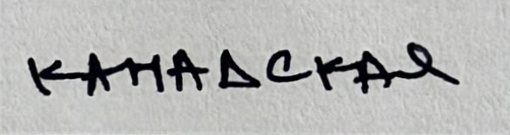канадская
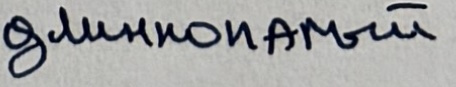длиннопалый
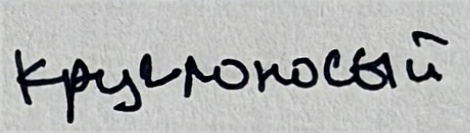круглоносый
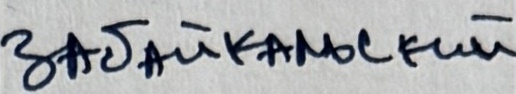забайкальский
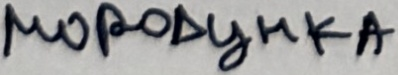мородунка
